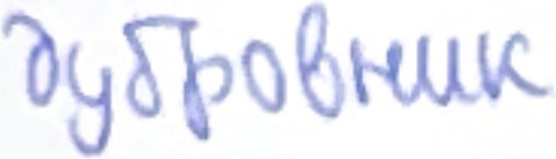дубровник
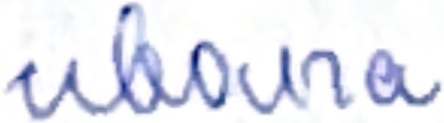иволга
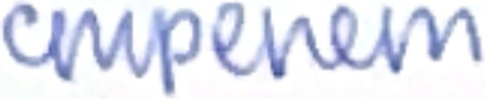стрепет
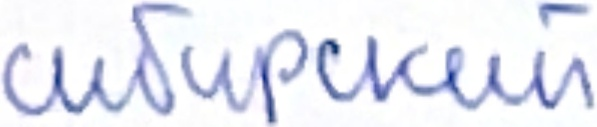сибирский
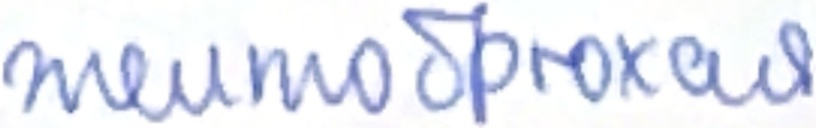желтобрюхая
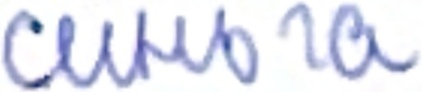синьга
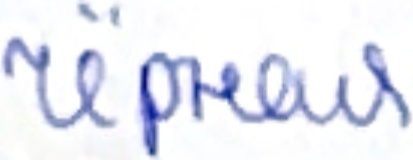чёрная
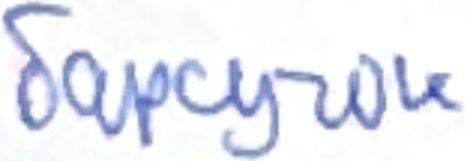барсучок
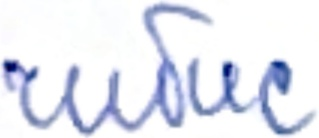чибис
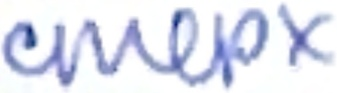стерх
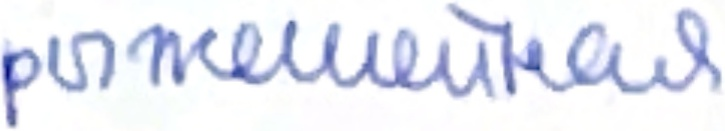рыжешейная
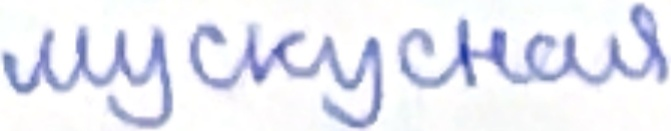мускусная
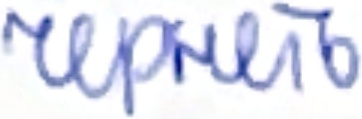чернеть
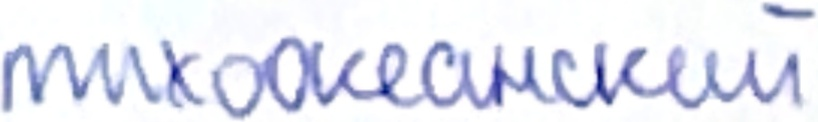тихоокеанский
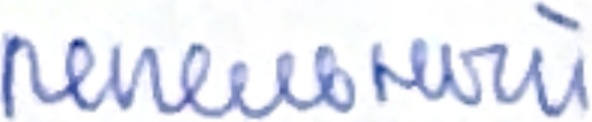пепельный
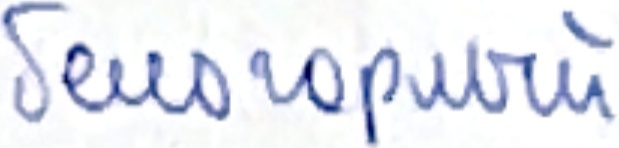белогорлый
